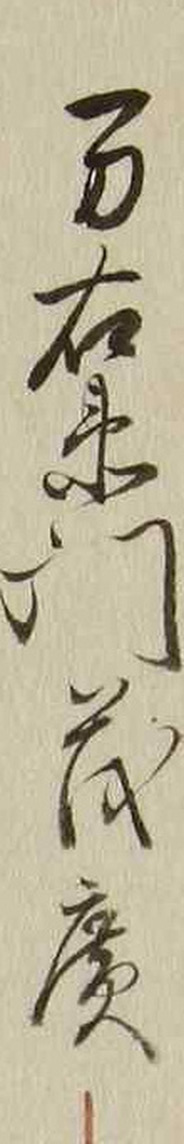万右衛門茂広
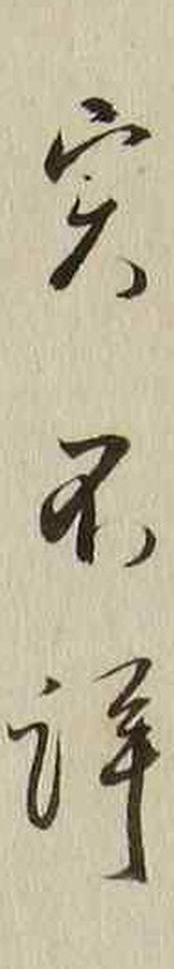実不詳
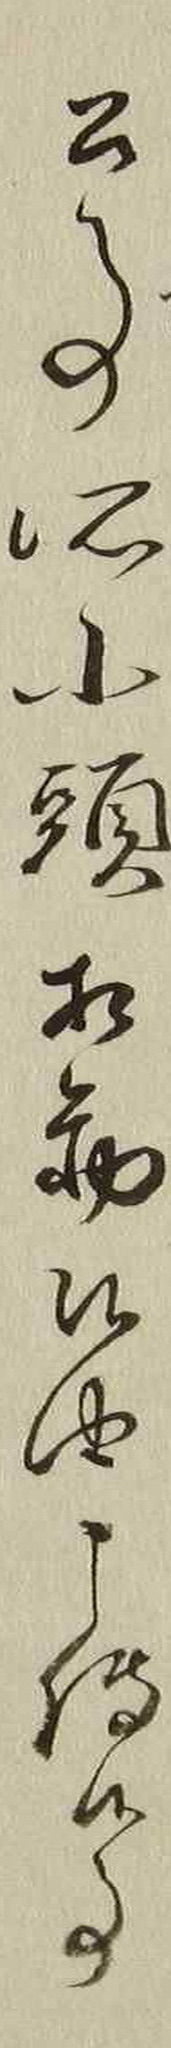公事所小頭相勤候由申伝候事
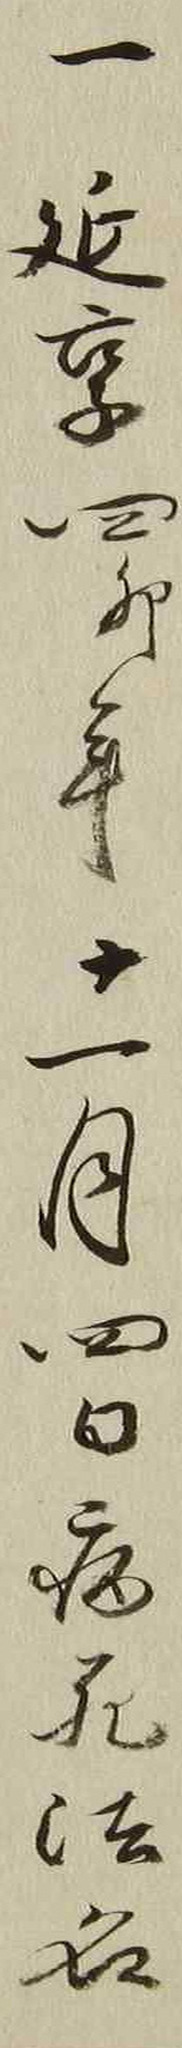一延享四卯年十一月四日病死法名
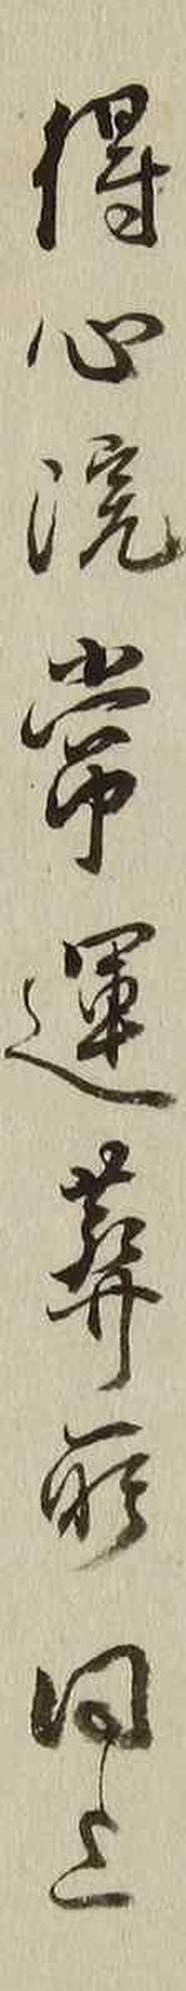得心院常運葬所同上
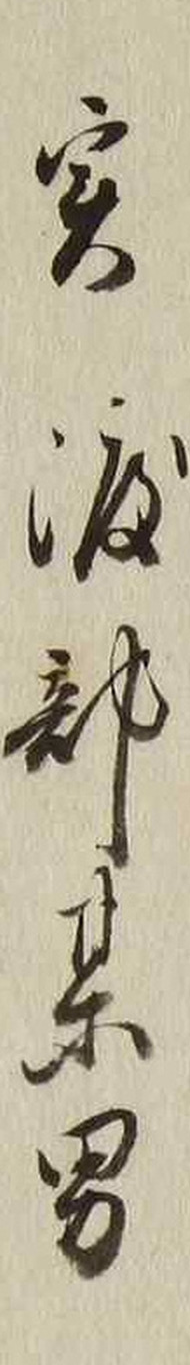実渡部某男
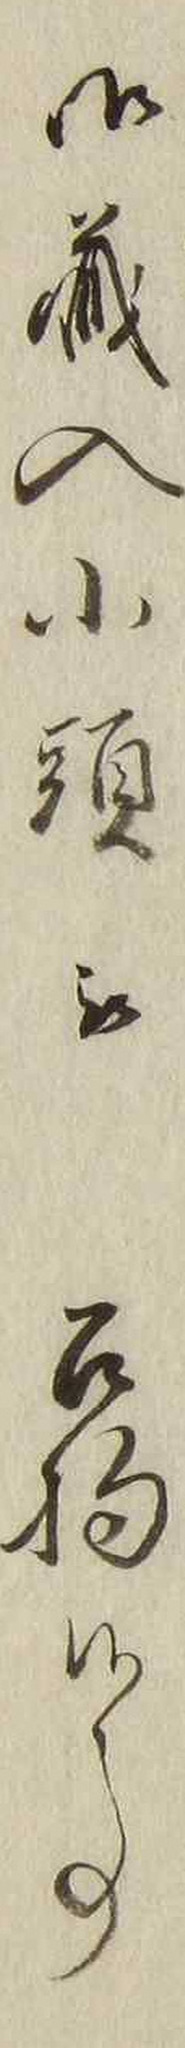御蔵入小頭被召抱候事

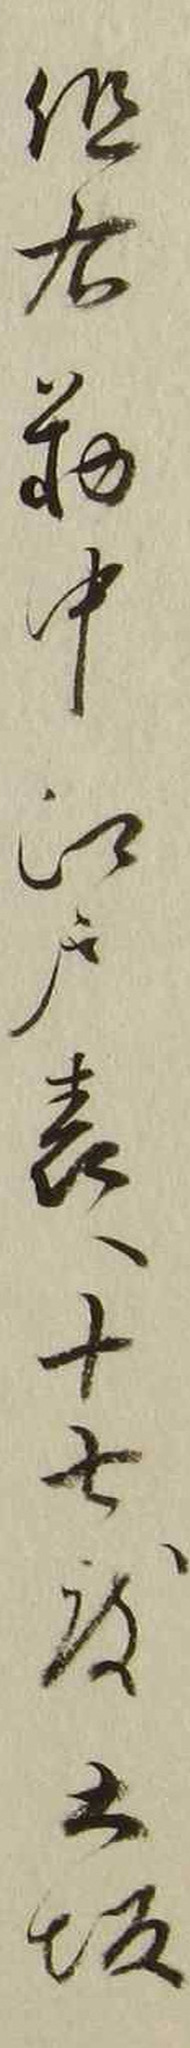但右勤中江戸表へ十七度大坂
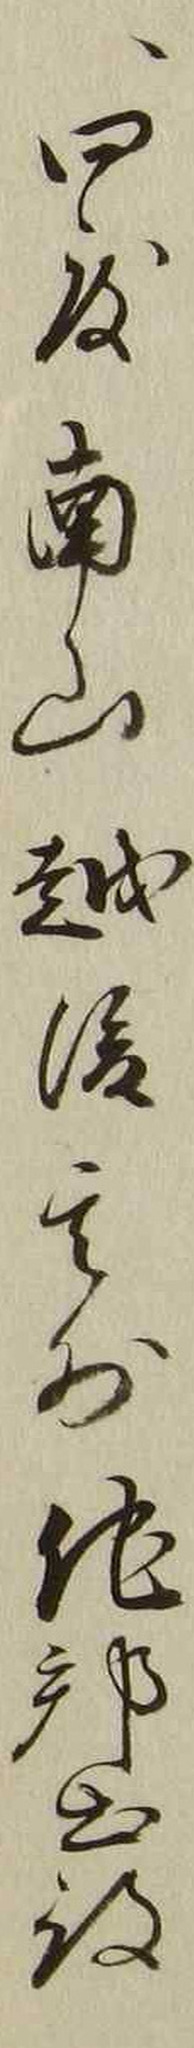へ四度南山越後其外他邦出役
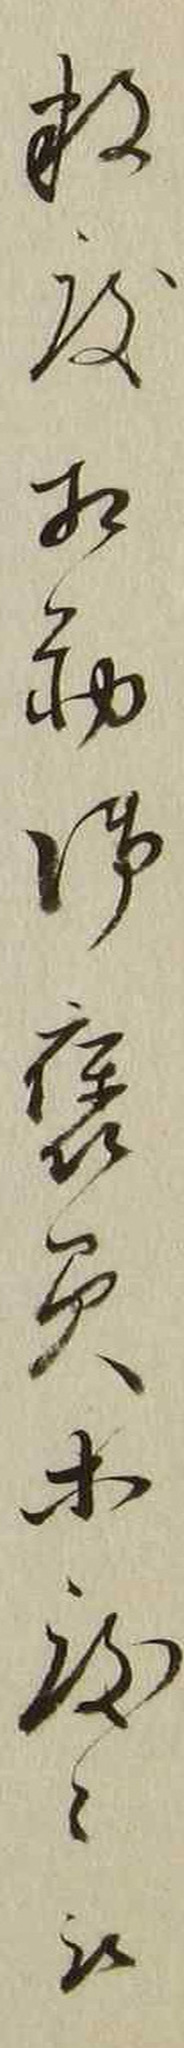数度相勤御褒美等度々被
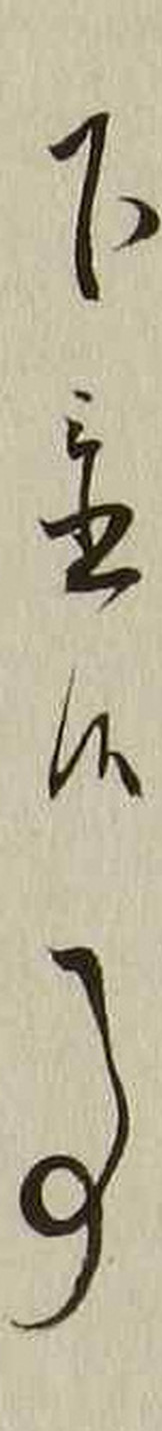下置候事
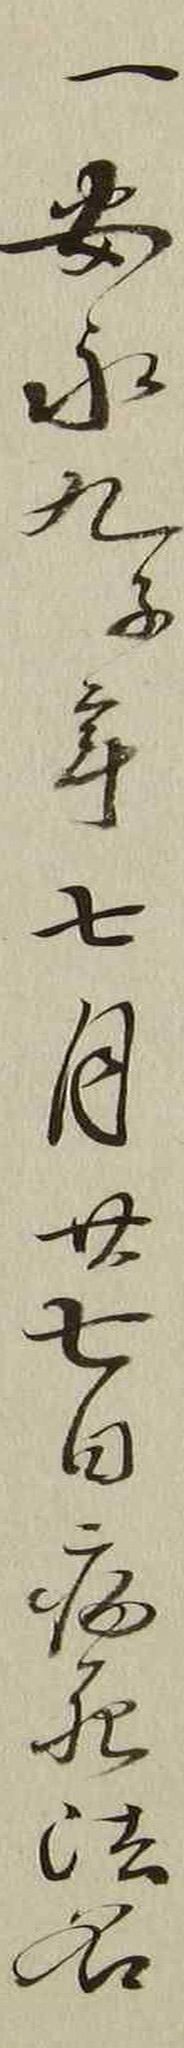一安永九子年七月廿七日病死法名
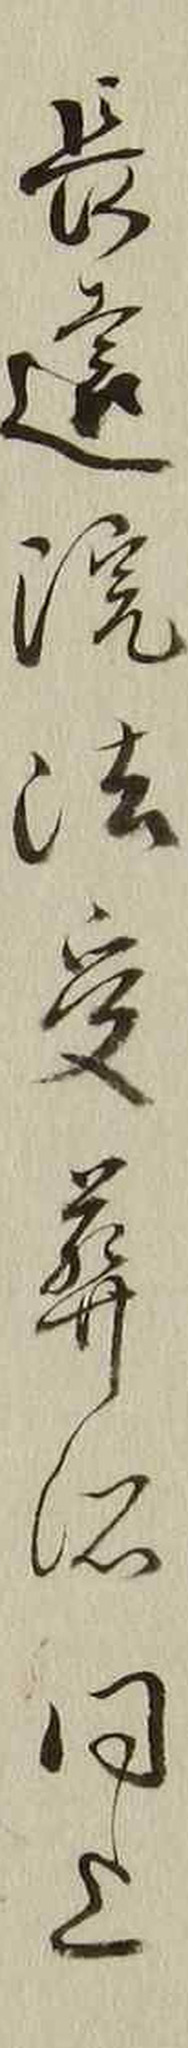長這院法受葬所同上
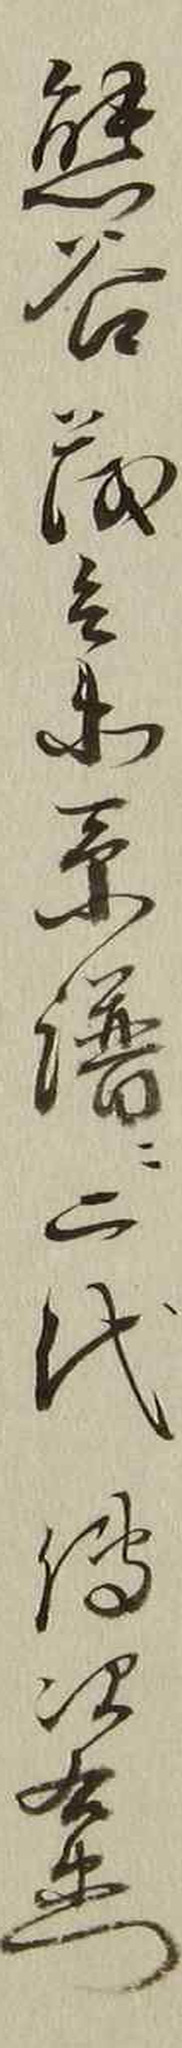熊谷茂兵衛系譜ニ二代伝次右衛門
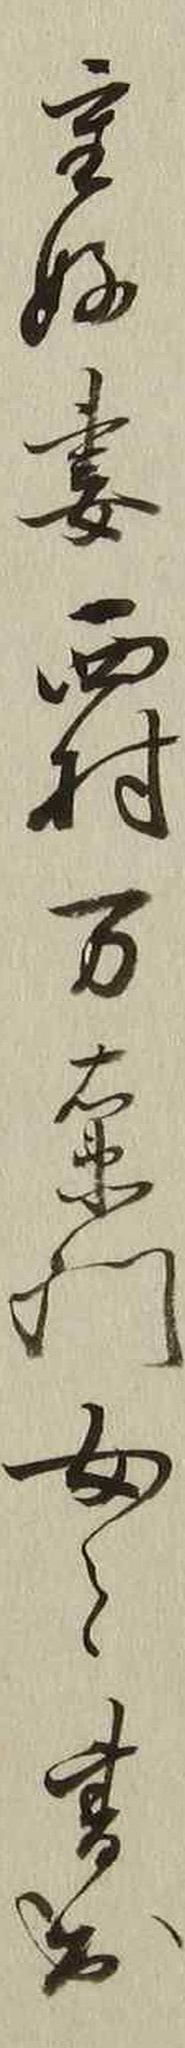重好妻西村万右衛門女と書出
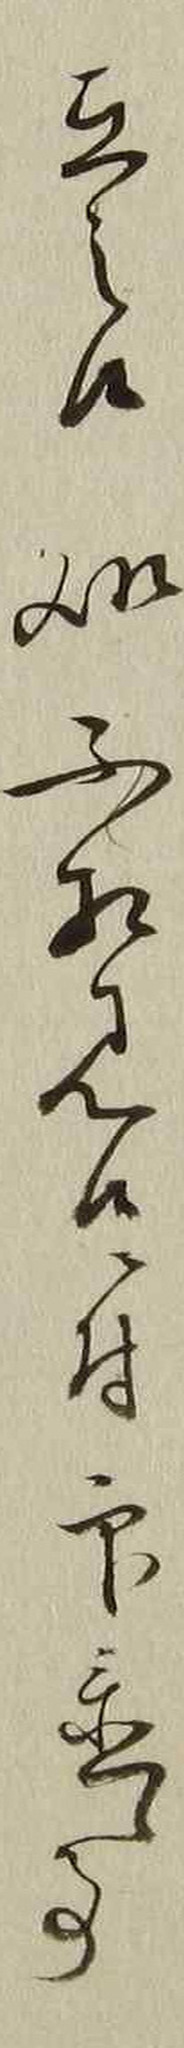在之候処不相見候ニ付印置候事
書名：諸士系譜　巻之52　に之部3
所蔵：会津若松市立会津図書館
